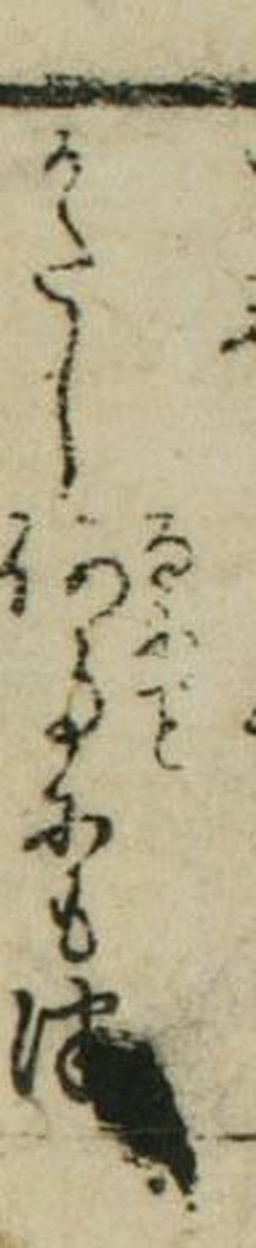かたし何事にもつ
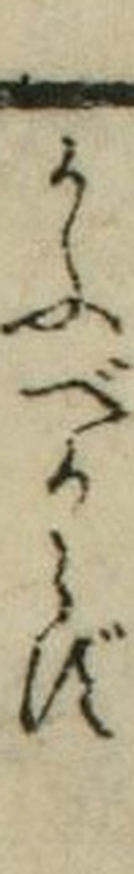かふべからず
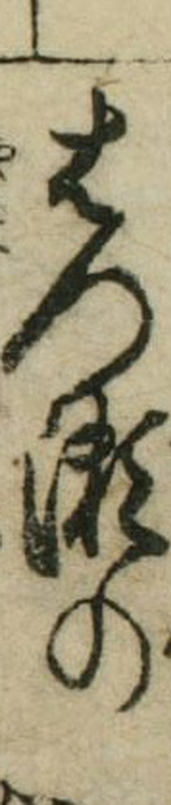はつ瀬の
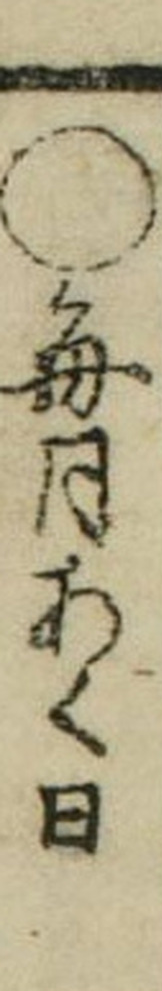○毎月あく日
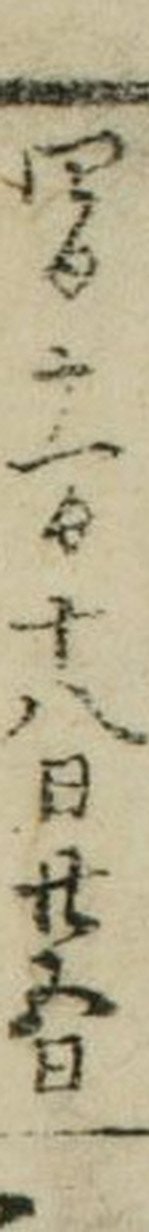四日十一日十八日廿五日
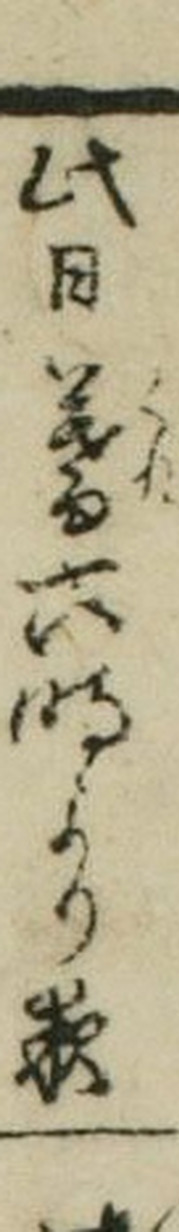此日暮六時より夜
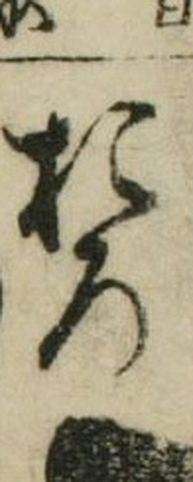おろし
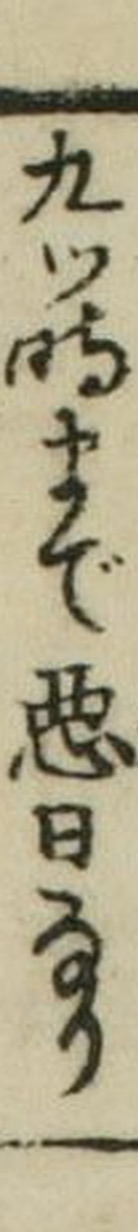九ツ時まで悪日なり
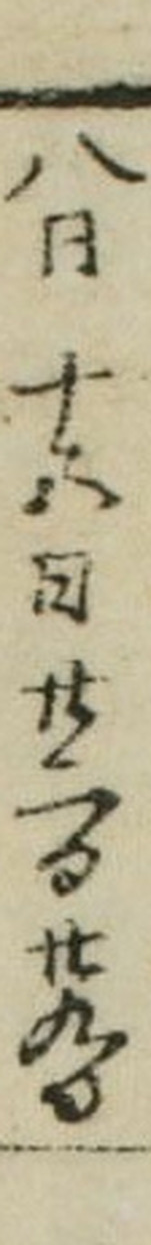八日十五日廿二日廿九日
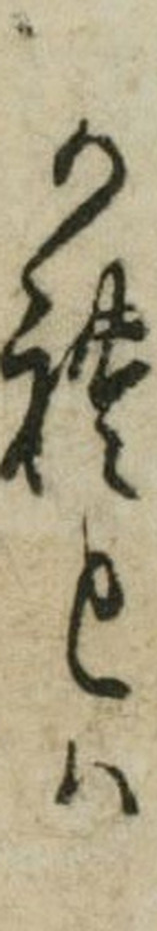かれとは
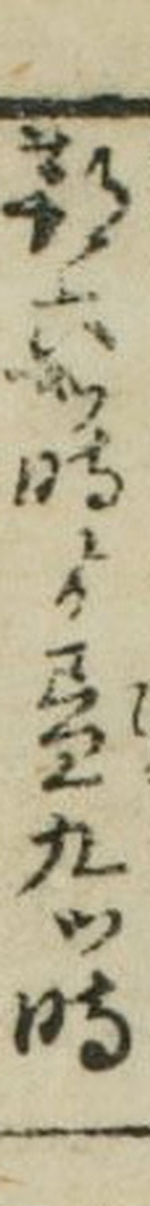朝六ツ時より昼九ツ時
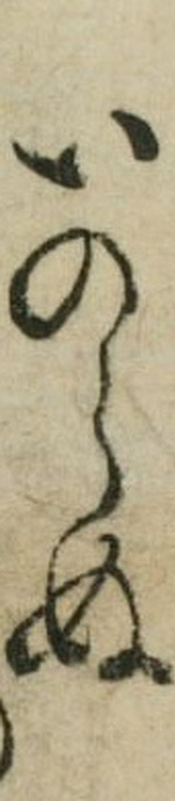いのらぬ
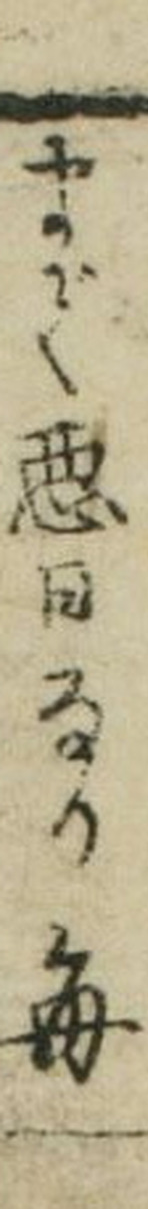まで悪日なり毎
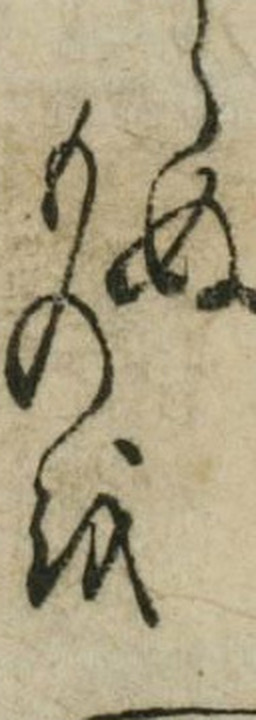ものを
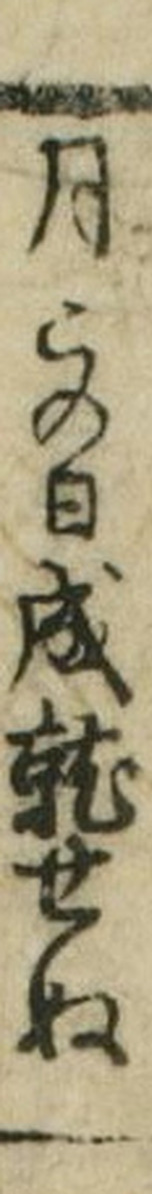月この日成就せぬ
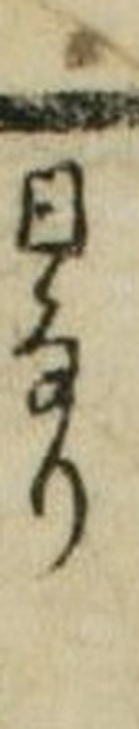日なり
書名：百人一首
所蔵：東京学芸大学教育コンテンツアーカイブ
